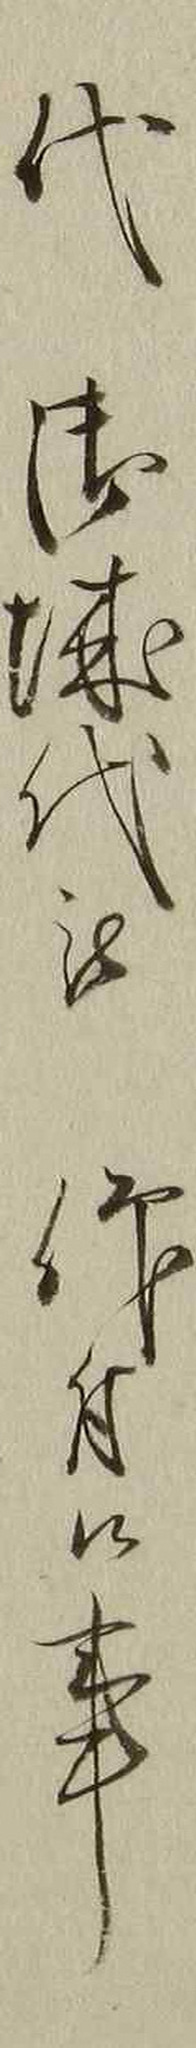代御城代被仰付候事
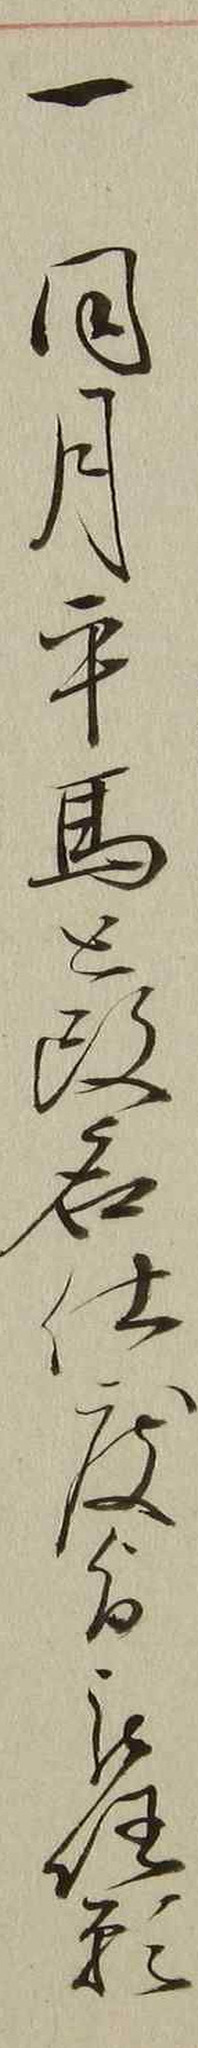一同月平馬と改名仕度旨被任願
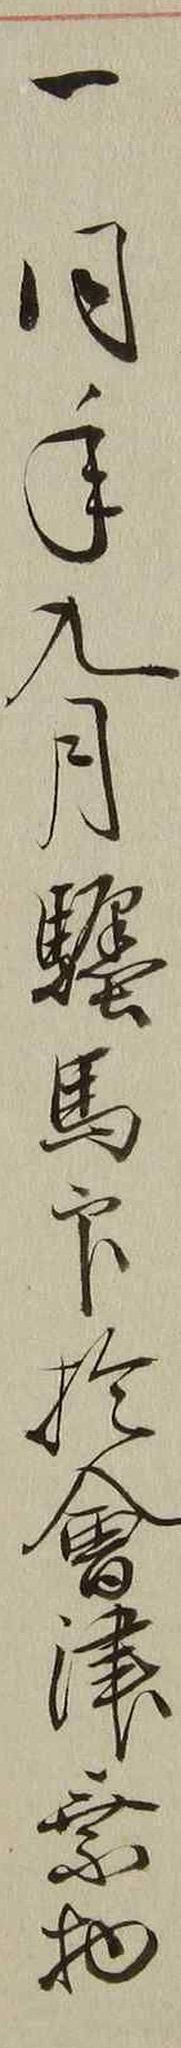一同年九月馬印於会津乗物
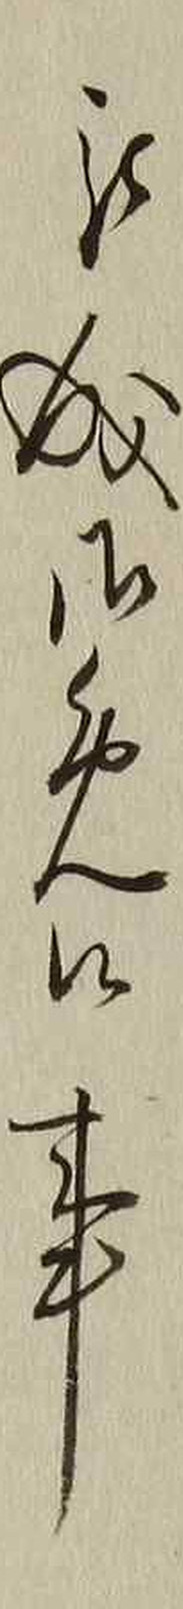被成御免候事
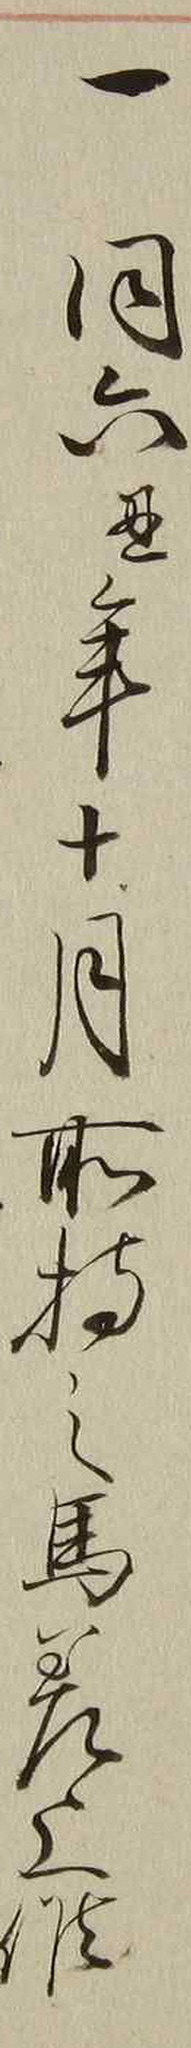一同六丑年十月所持之馬差上候
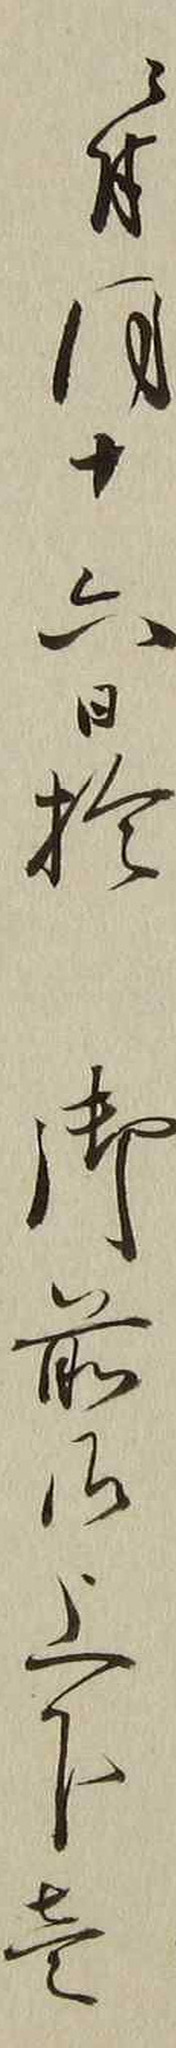に付同十六日於御前御上下壱
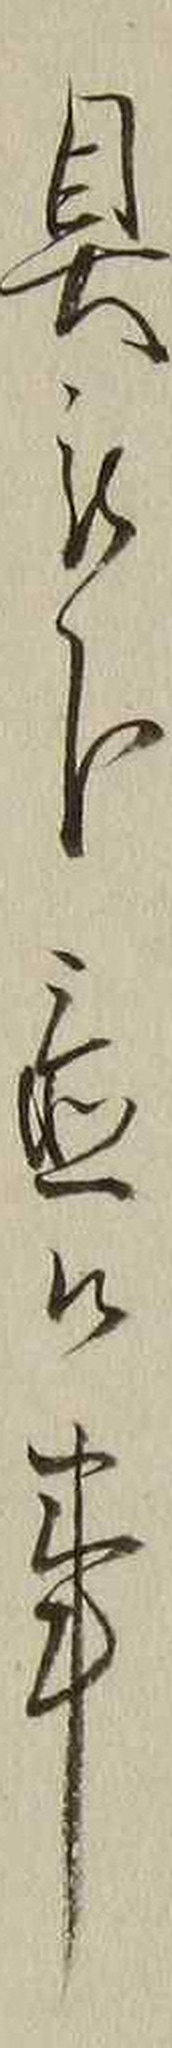具被下置候事
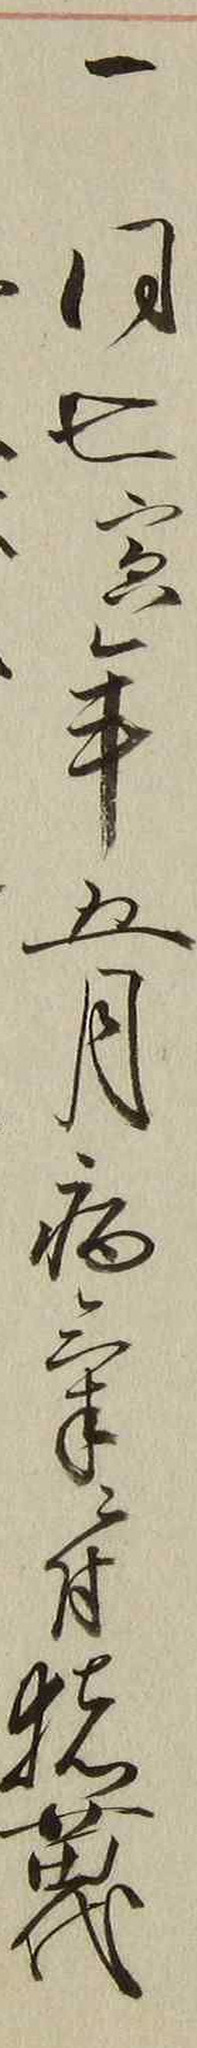一同七寅年五月病気に付猪苗代
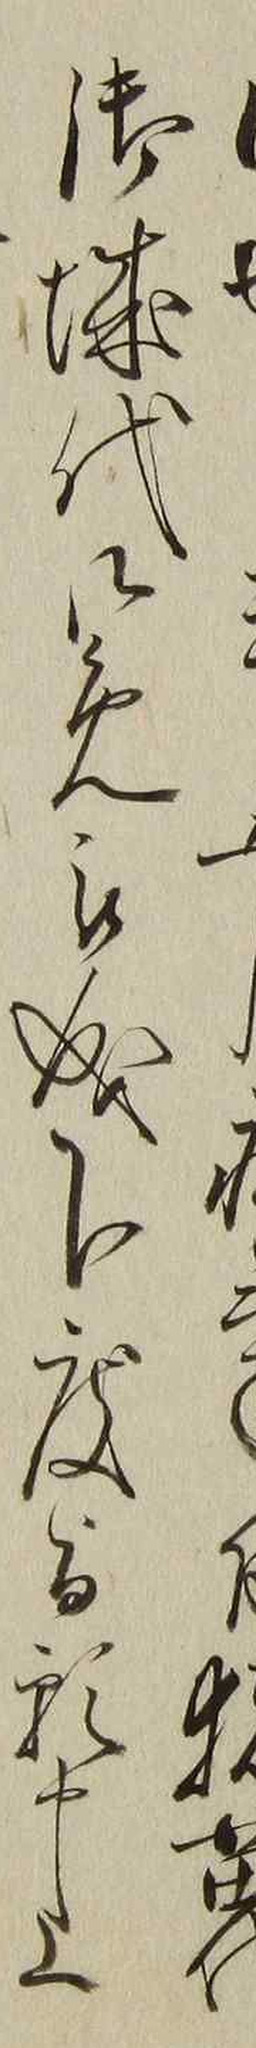御城代御免被成下度旨願申上
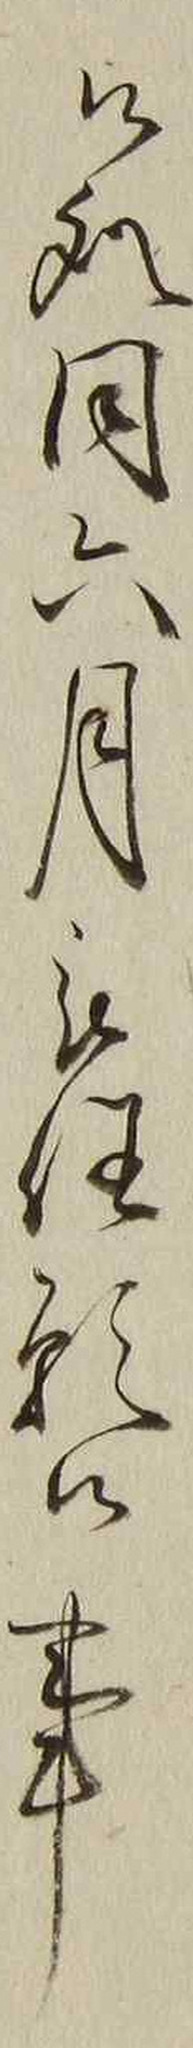候処同六月被住願候事
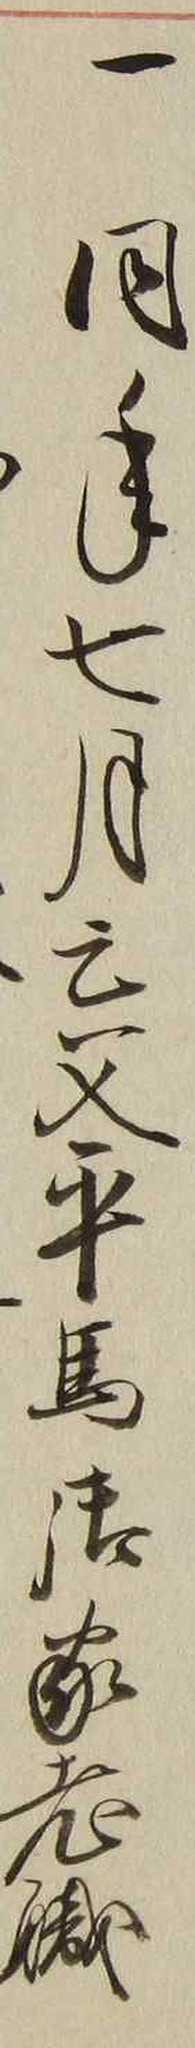一同年七月亡父平馬御家老職
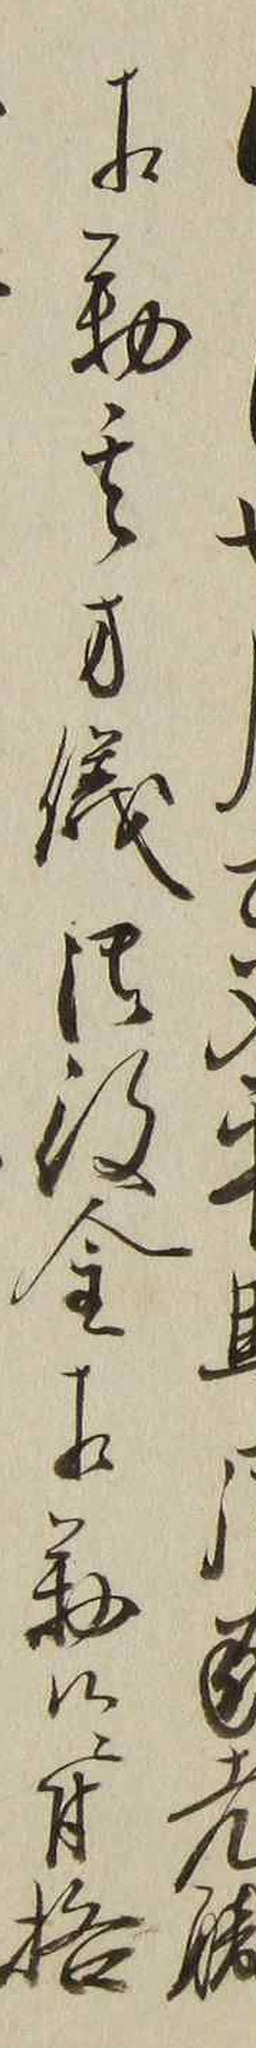相勤其方儀御役金相勤候に付格
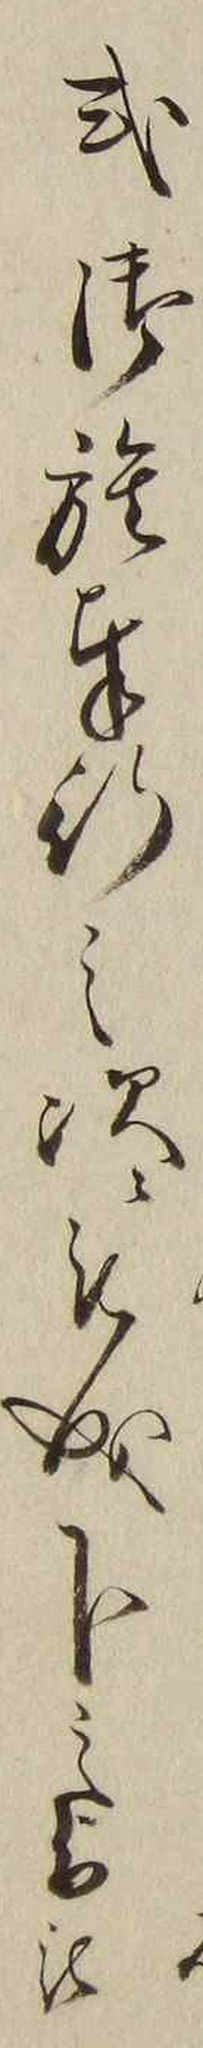式御旗奉行之次に被成下之旨被

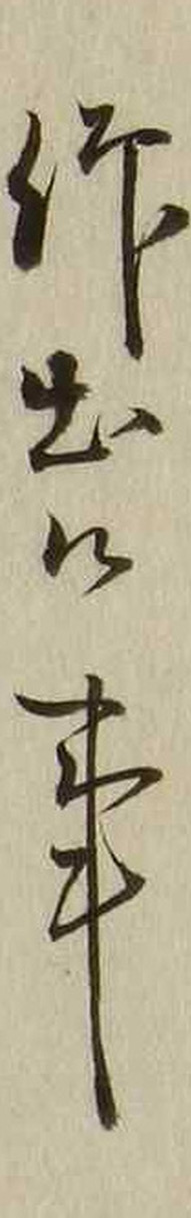仰出候事
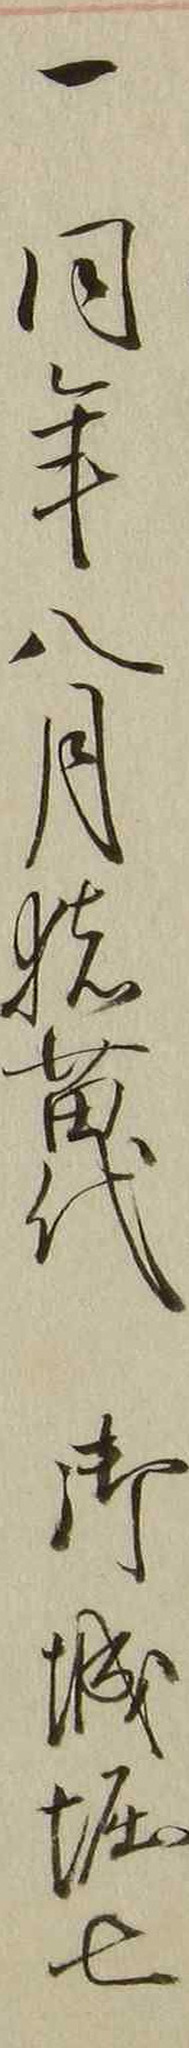一同年八月猪苗代御城堀七
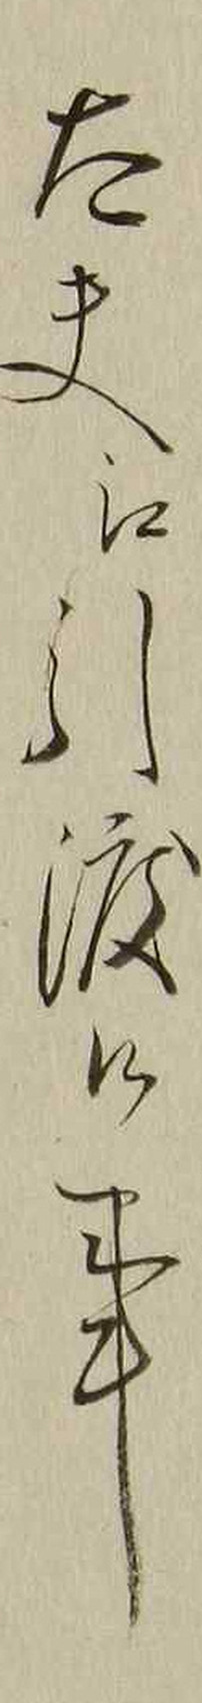太夫江引渡候事
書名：諸士系譜　巻之103　か之部11
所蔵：会津若松市立会津図書館
